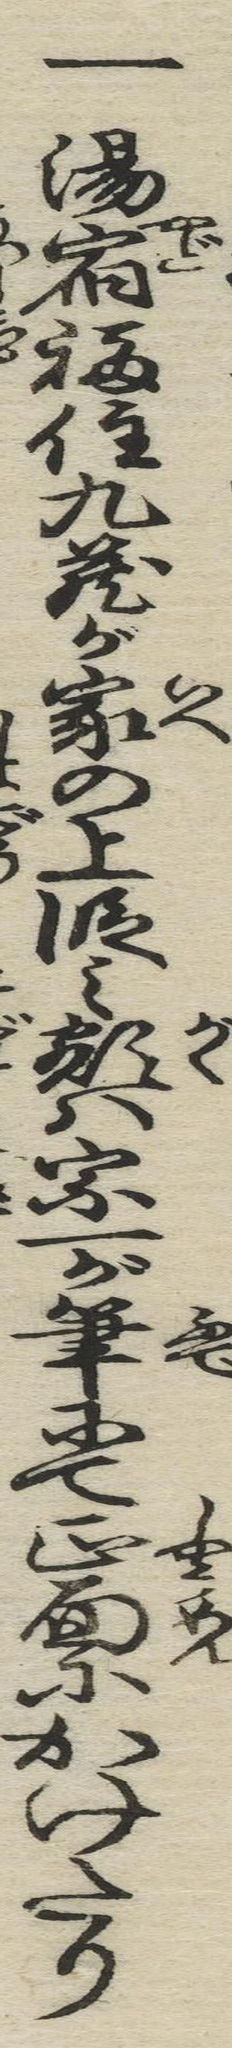一湯宿福住九蔵が家の上框？の額は宗一が筆にて正面にかけたり
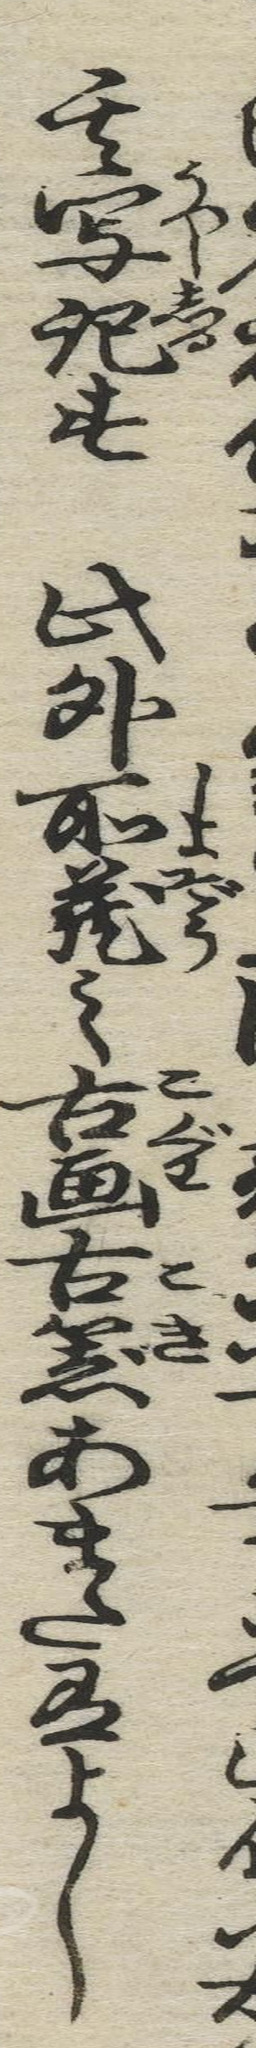其写記す此外所蔵の古画古器あまた有よし
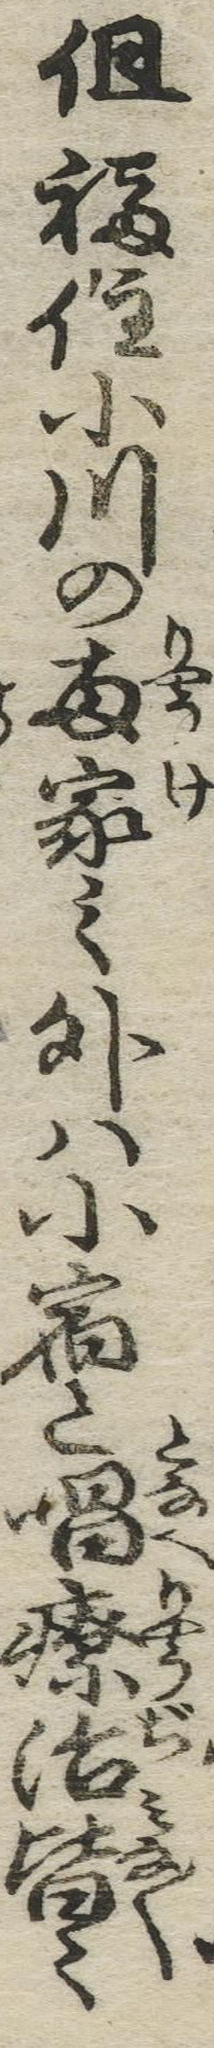但福住小川の両家の外は小宿と唱療治皆々
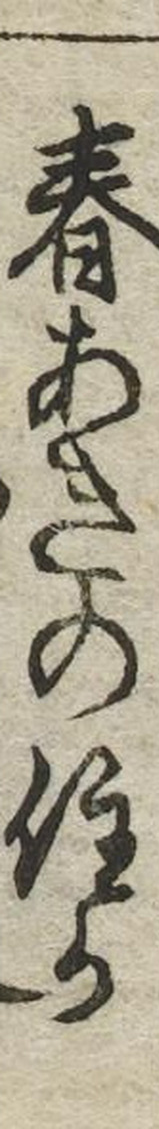春あきの住か
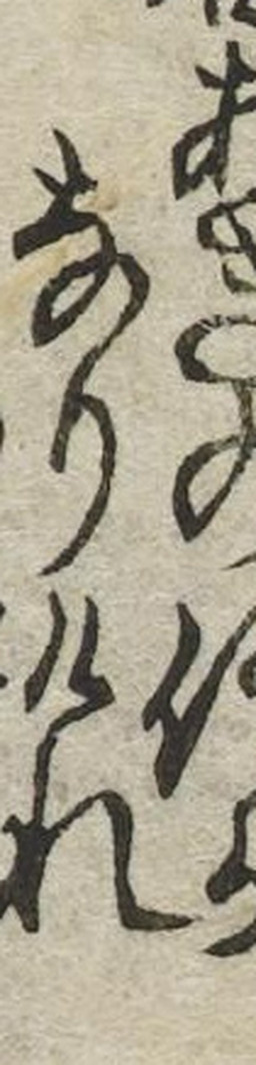なりけれ
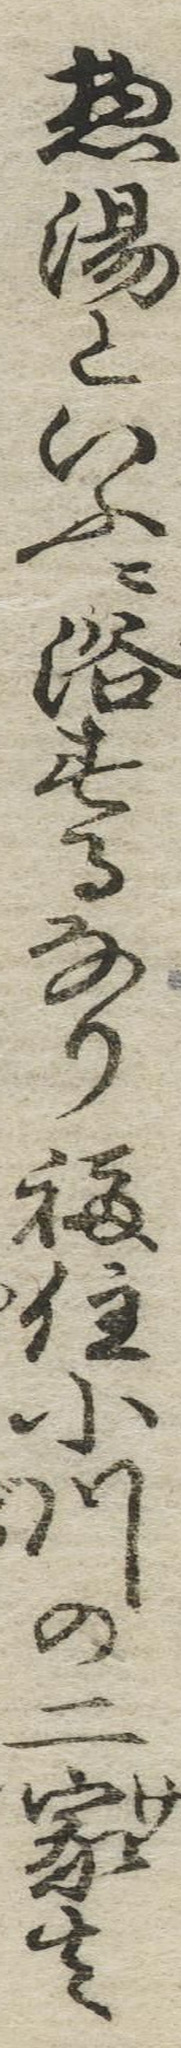惣湯といふに浴するなり福住小川の二家を
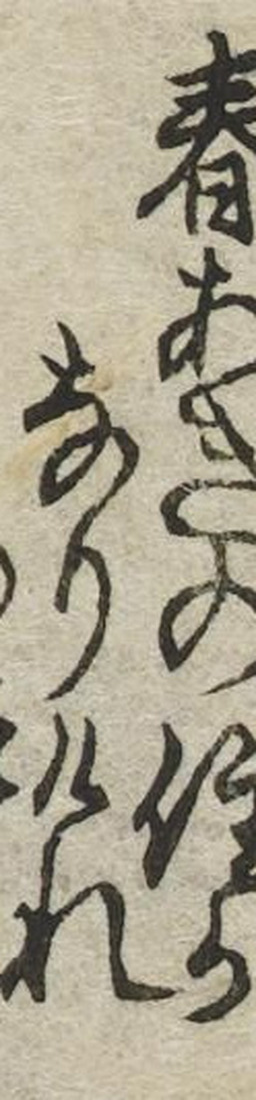なりけれ
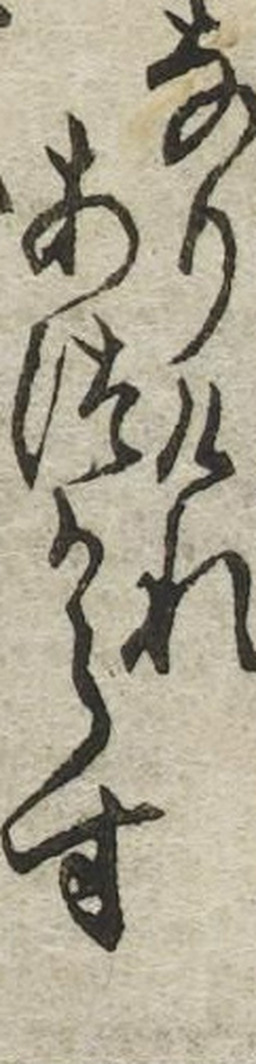あつからす
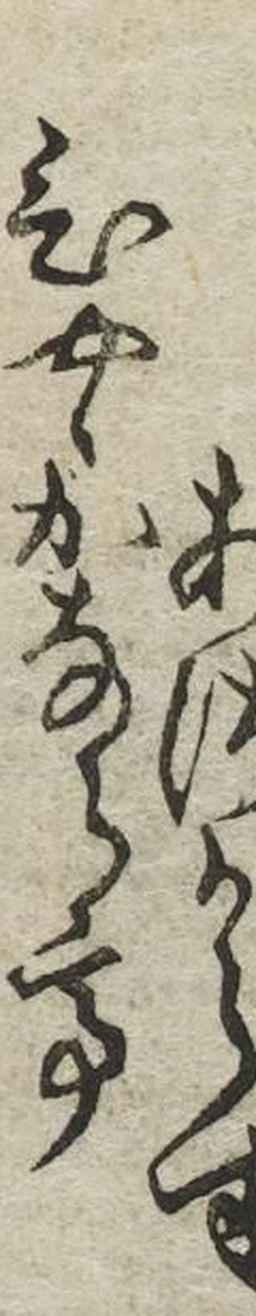ひやゝかなる事
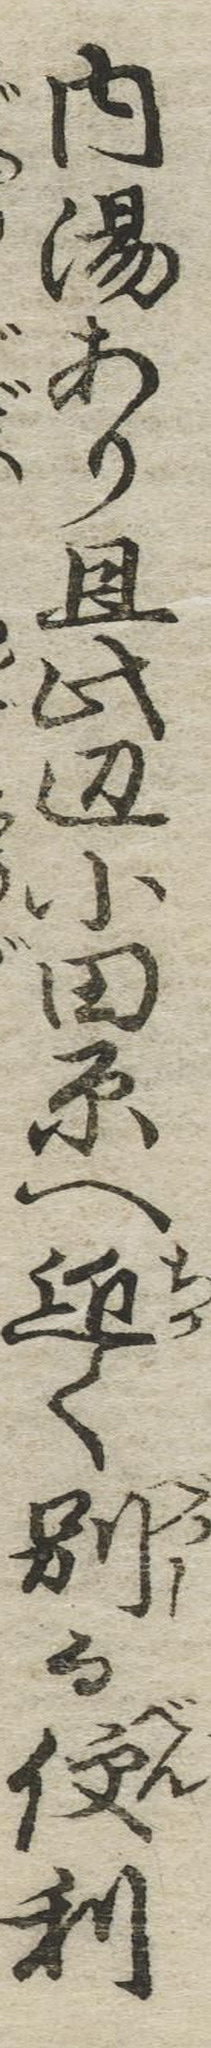内湯あり且此辺小田原へ近く別る便利
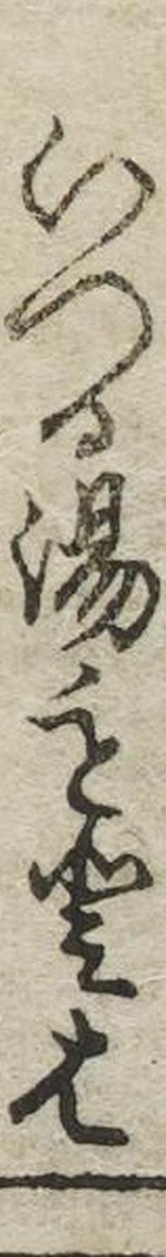いつる湯のをとは
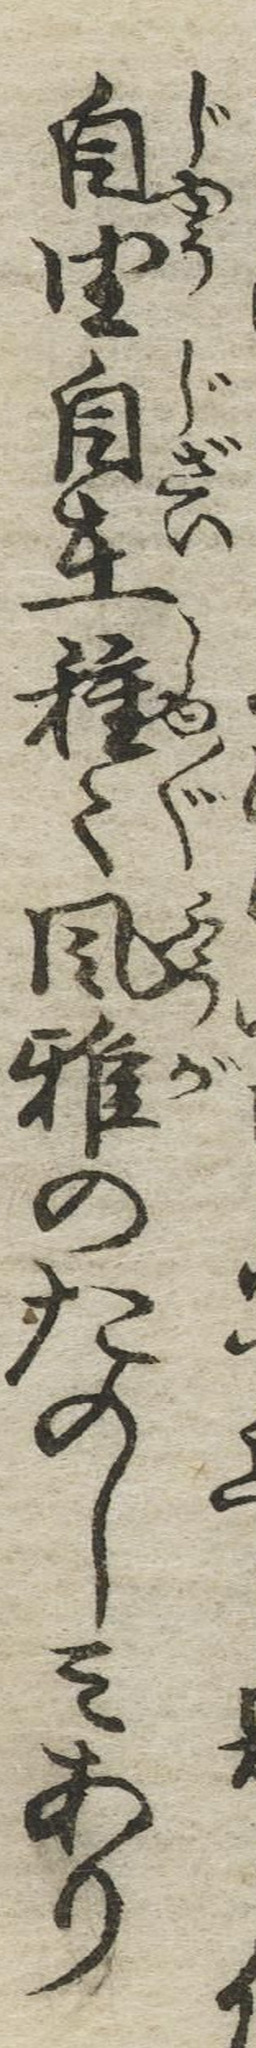自由自在種々風雅のたのしみあり

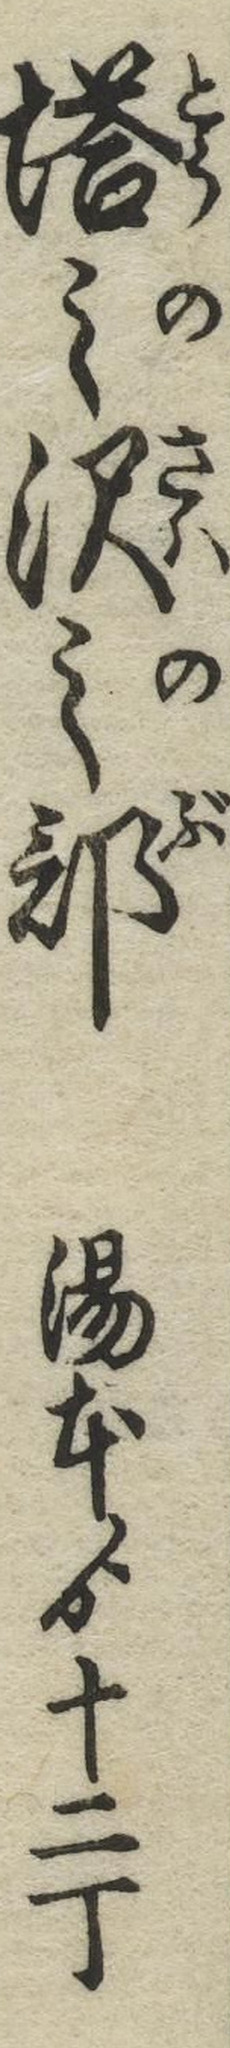塔之澤之部湯本より十二丁
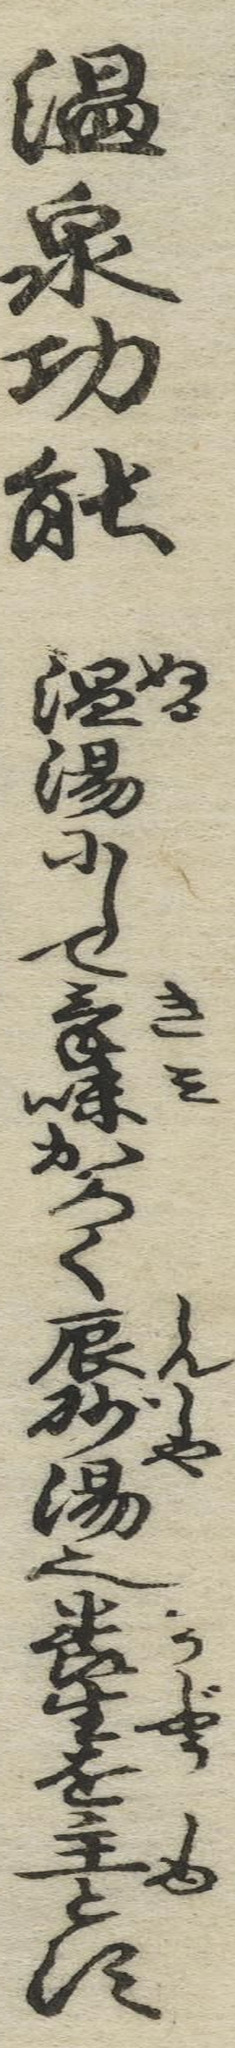温泉功能温湯にて氣味かろく辰砂湯也養生を主とす
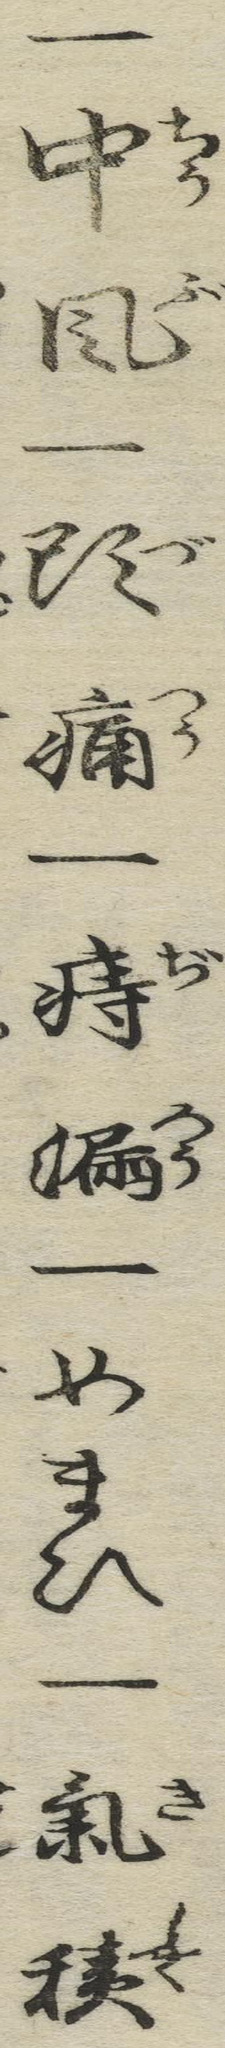一中風一頭痛一痔瘻一めまいひ一氣積
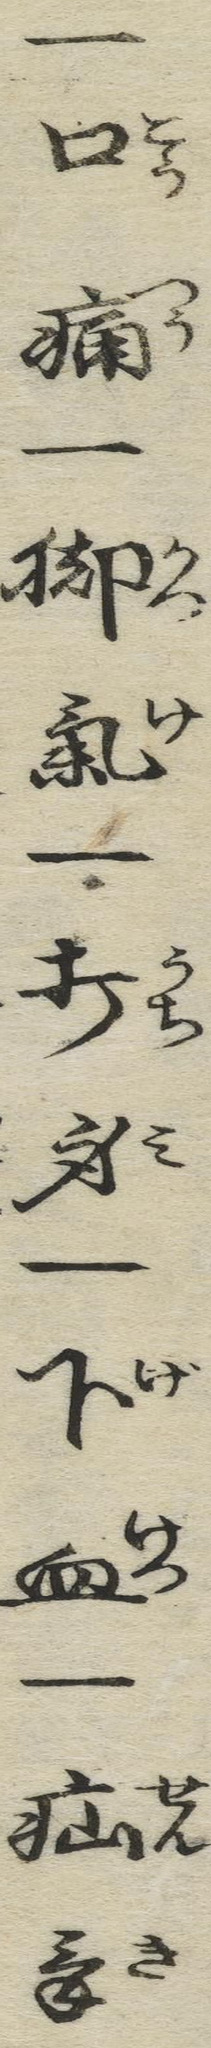一口痛一脚氣一打身一下血一疝氣
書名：箱根七湯　温泉圖會　全
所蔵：東京大学地震研究所図書室 Earthquake Research Institute Library, The University of Tokyo, JAPAN
